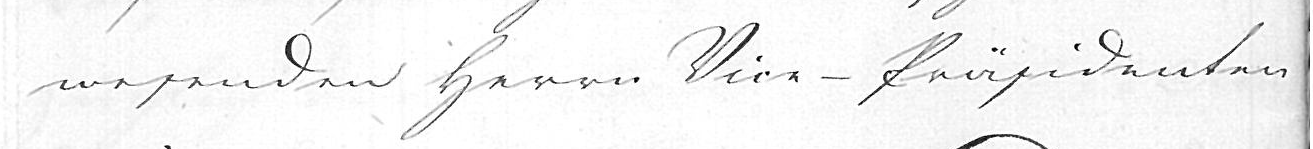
wesenden Herrn Vice-Präsidenten
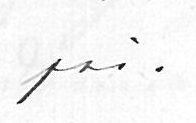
sei.
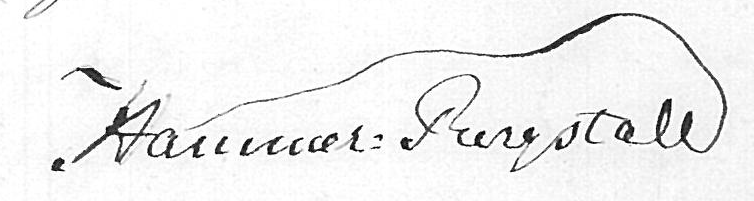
Hammer-Purgstall
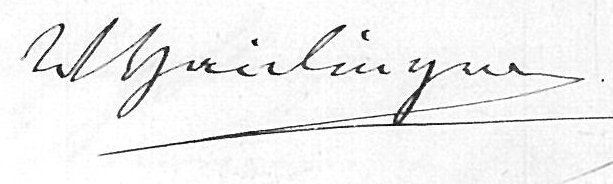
WHaidinger
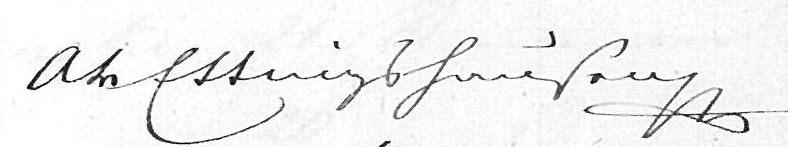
AvEttingshausen
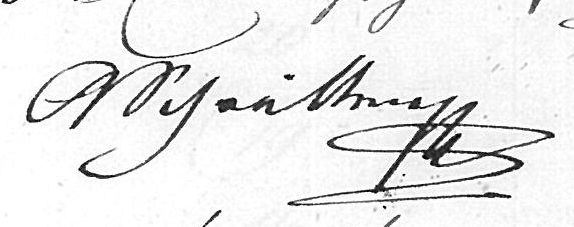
ASchrötter
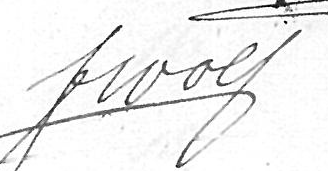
FWolf
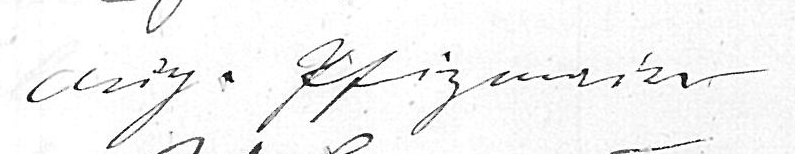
Aug. Pfizmaier
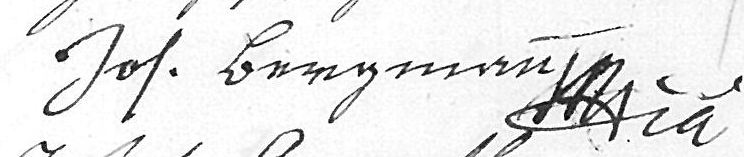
Jos. Bergmann
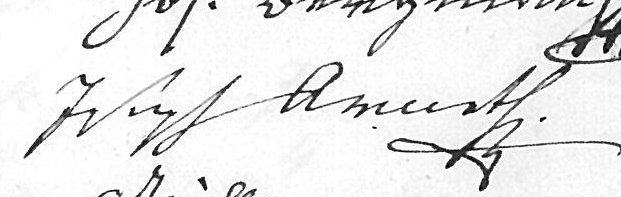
Joseph Arneth
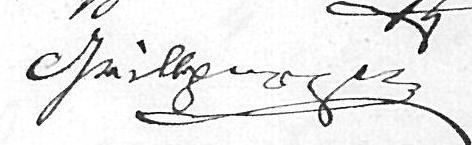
Grillparzer
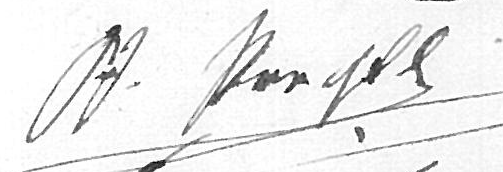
J.J. Prechtl
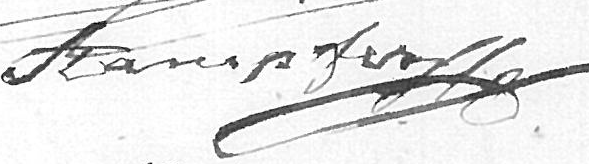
Stampfer
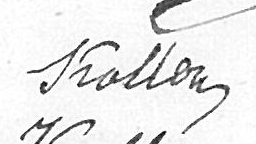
Koller
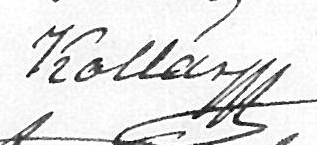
Kollar
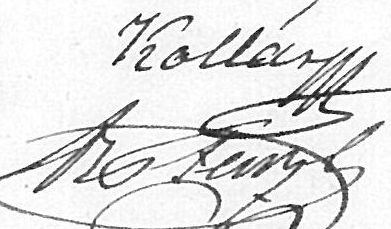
Ed. Fenzl
